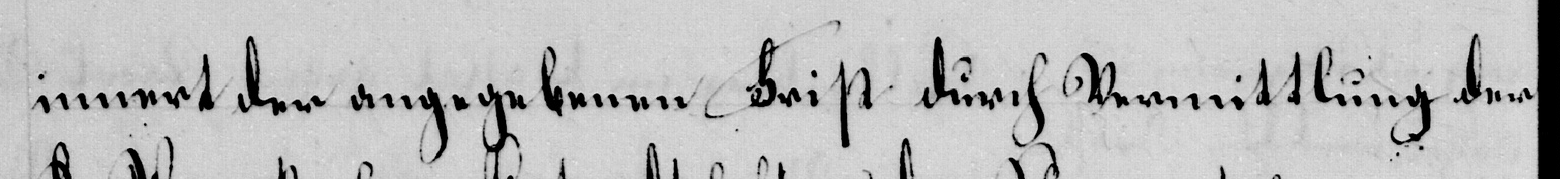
innert der angegebenen Frist durch Vermittlung der
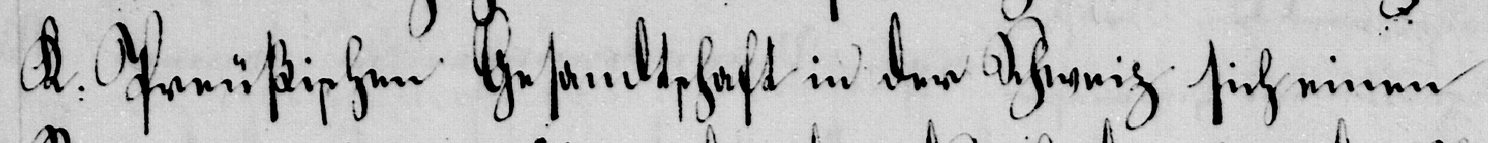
K. Preußischen Gesandtschaft in der Schweiz sich einen
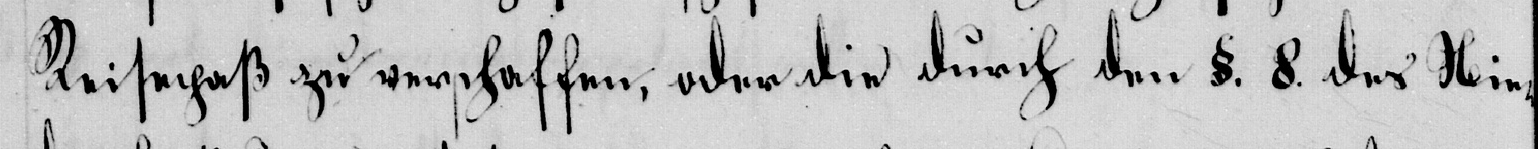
Reisepaß zu verschaffen, oder die durch den §. 8. des Nie¬
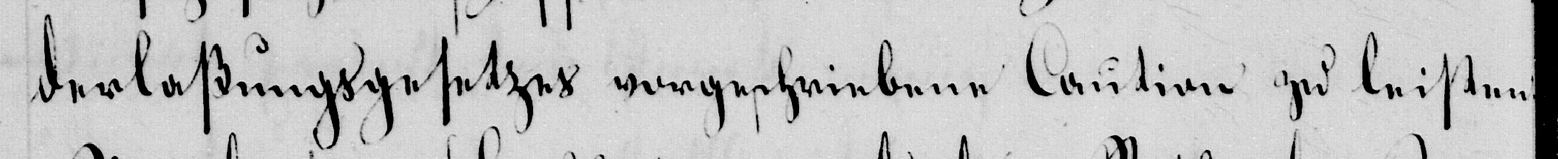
derlaßungsgesetzes vorgeschriebene Caution zu leisten.
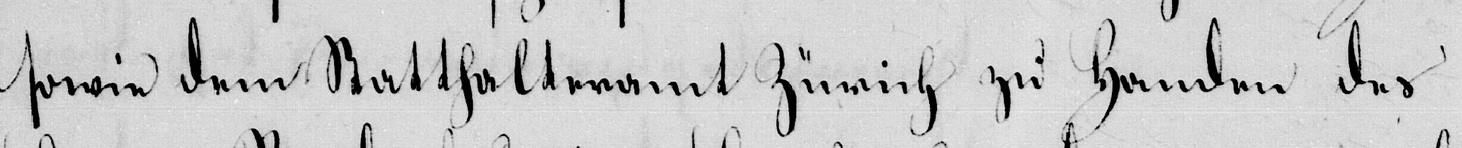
sowie dem Statthalteramt Zürich zu Handen des
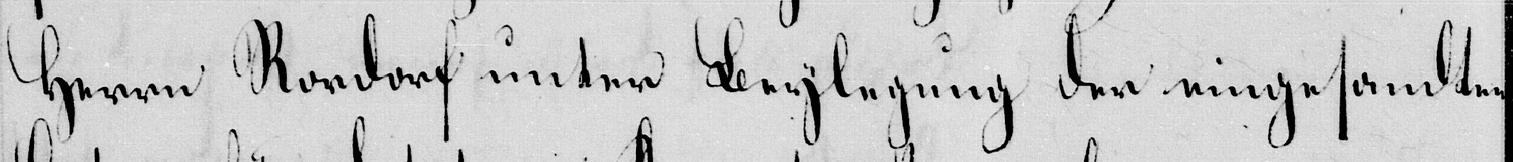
Herrn Rordorf unter Beylegung der eingesandten
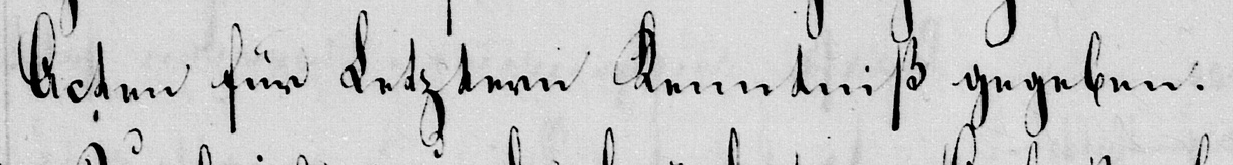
Acten für Letztern Kenntniß gegeben.
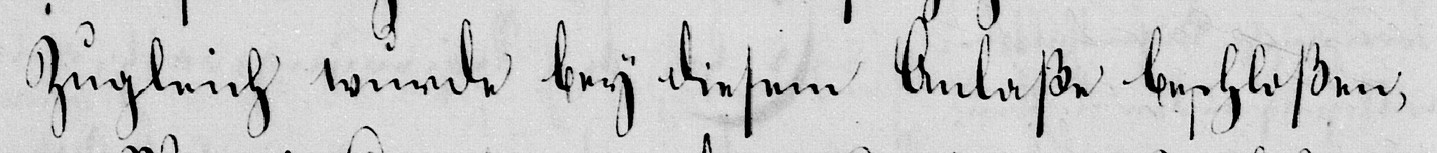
Zugleich wurde bey diesem Anlaße beschloßen,
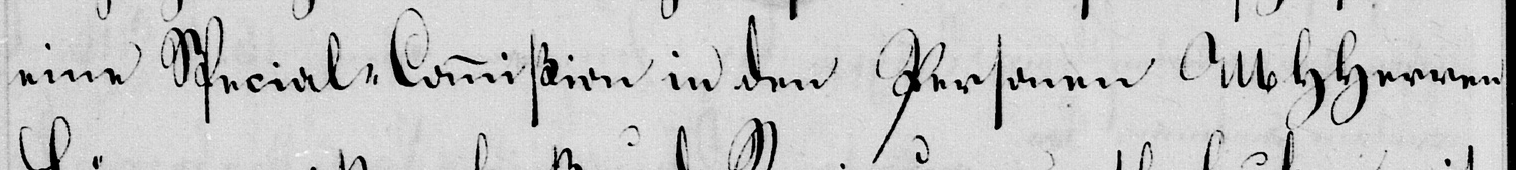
eine Special-Commißion in den Personen MHHerren
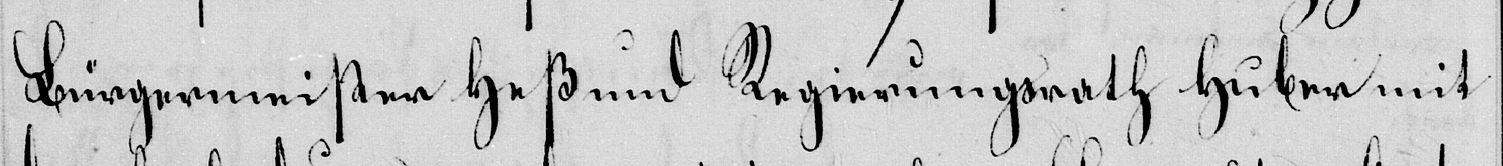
Bürgermeister Heß und Regierungsrath Huber mit
